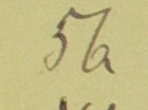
56
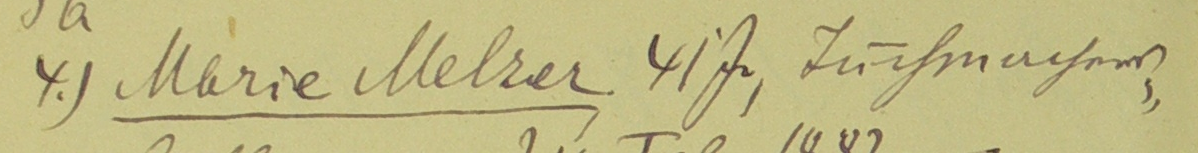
4.) Marie Melzer 41 J. Tuchmacher
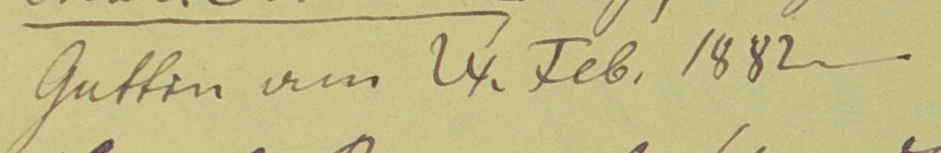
Gattin. + am 24.Febr. 82
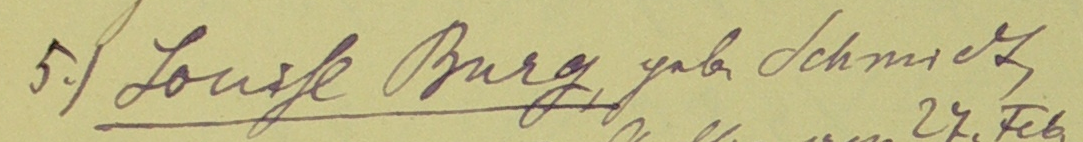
5.) Louise Burg geb. Schmidt,
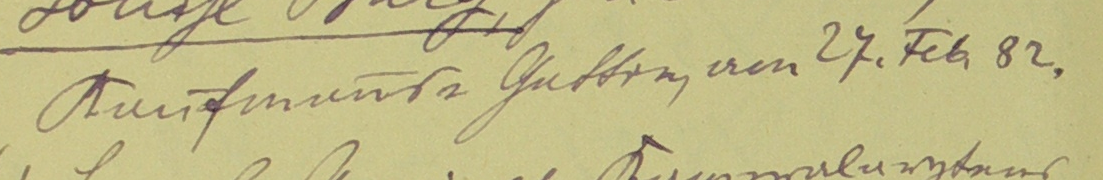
Kaufmanns Gattin + am 27. Febr. 82
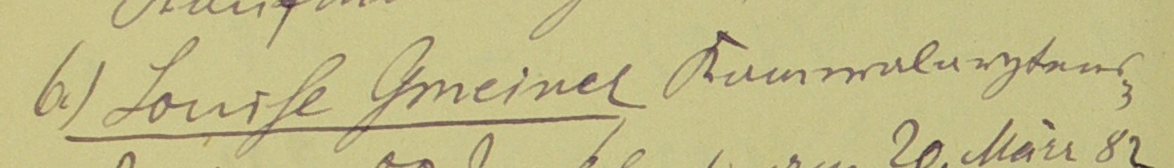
6.) Louise Gmeiner, Kommunal-Arzt
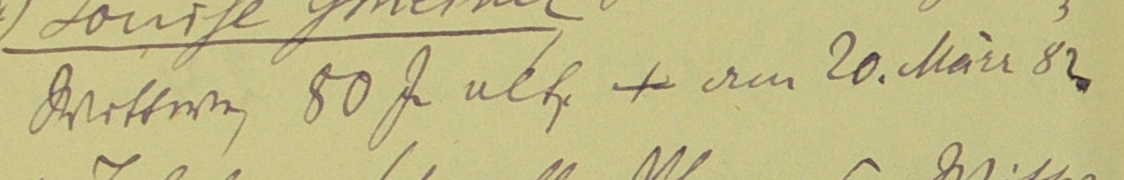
Witwe 80 J. + am 20. März 82
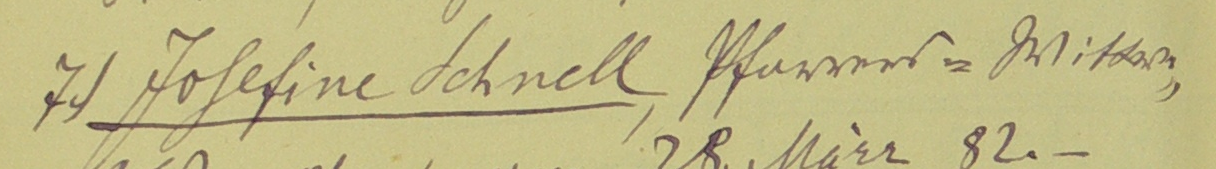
7.) Josefine Schnell, Pfarrers Witwe
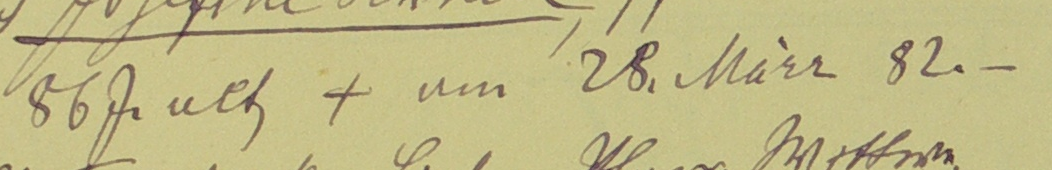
86 J. alt + am 28. März 82
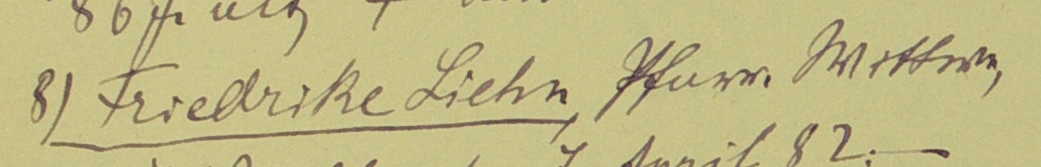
8.) Friedrike Lietin, Pfarrers Witwe,
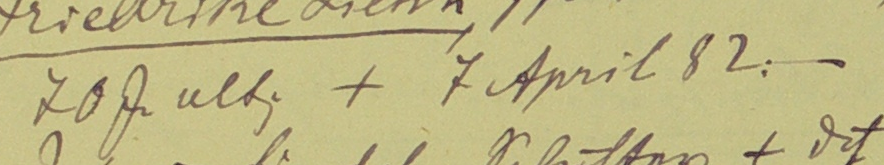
70 J. alt + am 7. April 82
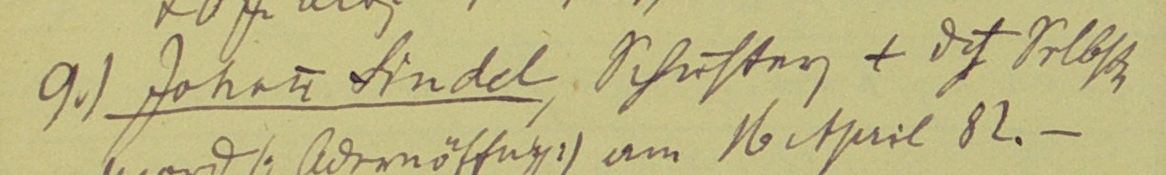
9.) Johan Sindel, Schuster, Selbst¬
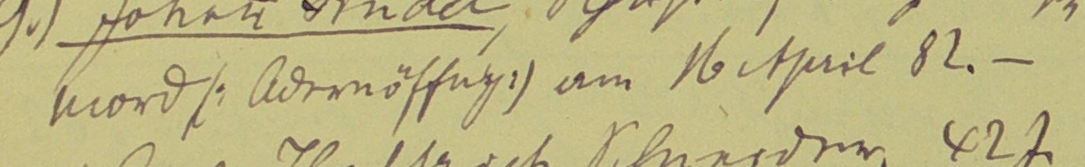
mord, Ader öffn. + am 16. April 82
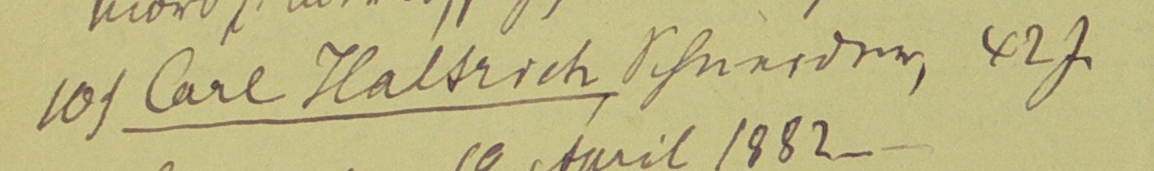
10.) Carl Haltrich, Schneider, 42 J.
